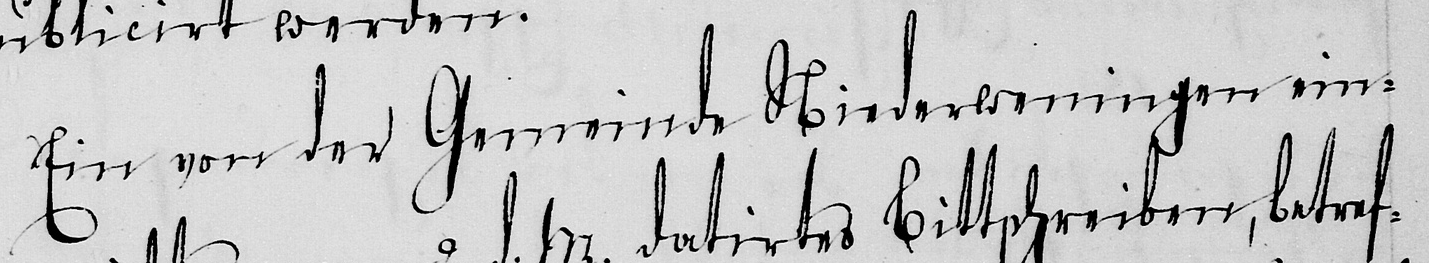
Ein von der Gemeinde Niederwenigen ein¬
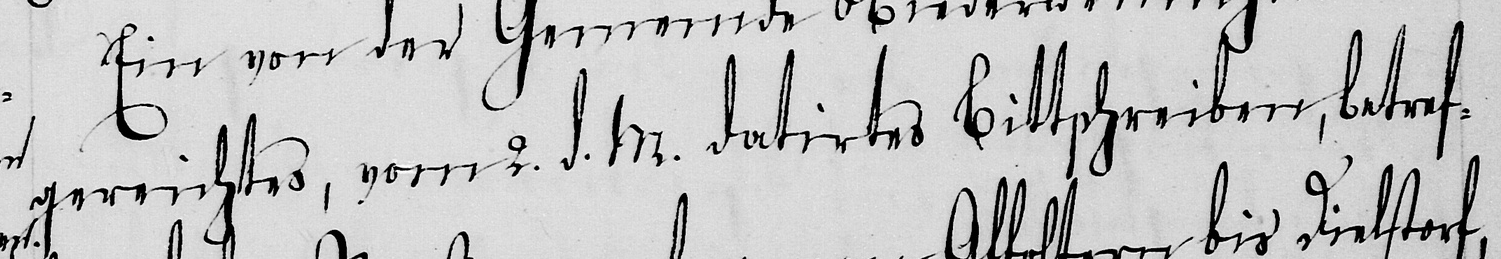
gereichtes, vom 2. d. M. datirtes Bittschreiben, betref¬
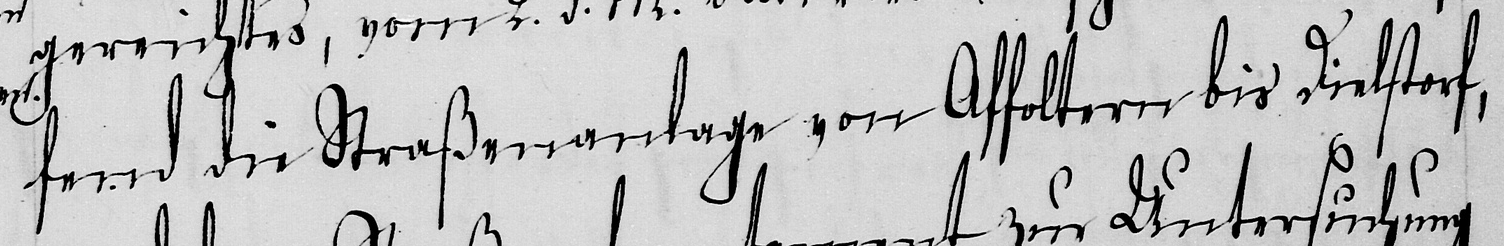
fend die Straßenalage von Affoltern bis Dielstor¬
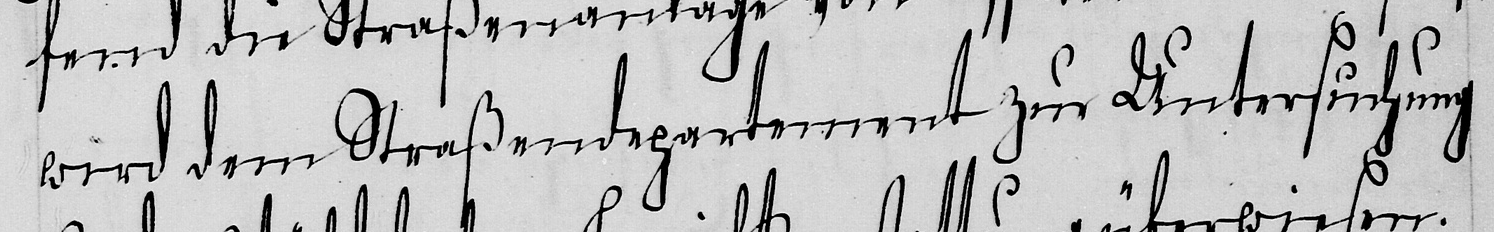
wird dem Straßendepartement zur Untersuchung
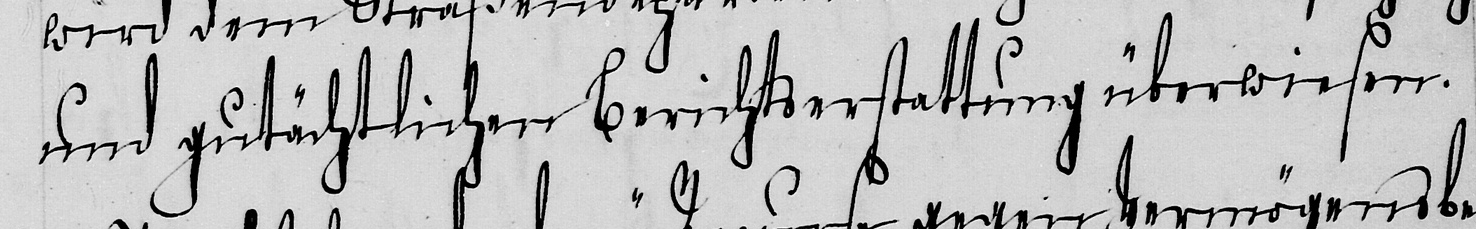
und gutächtlichen Berichtserstattung überwiesen.
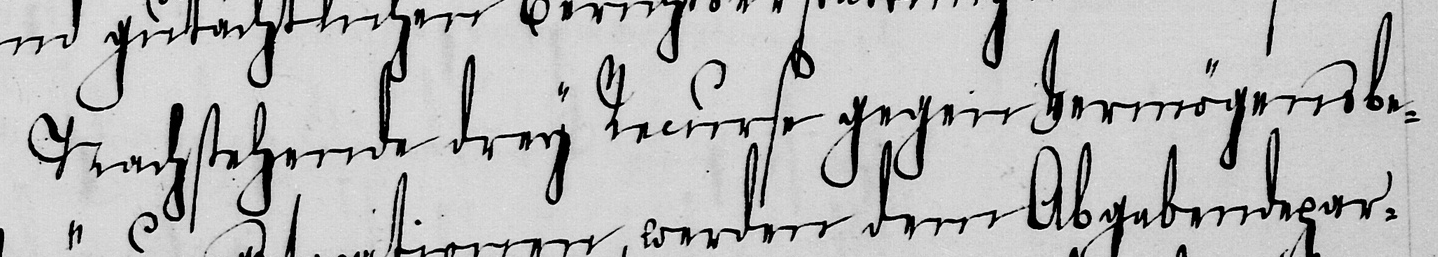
Nachstehende drey Recurse gegen Vermögensbe¬
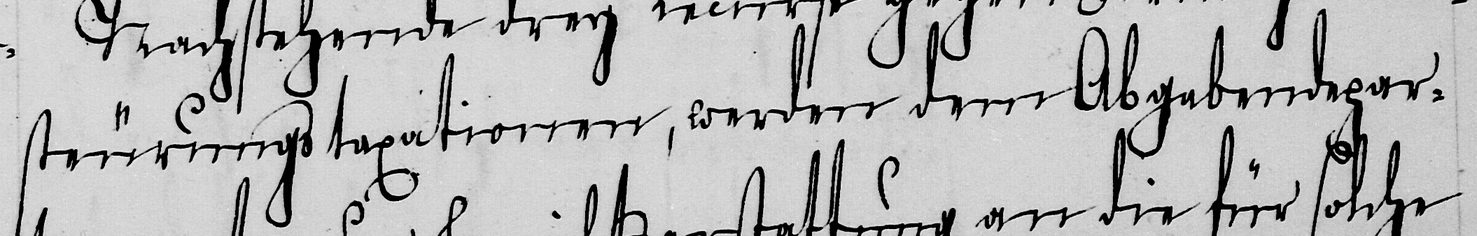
steurungstaxationen, werden dem Abgabendepar¬
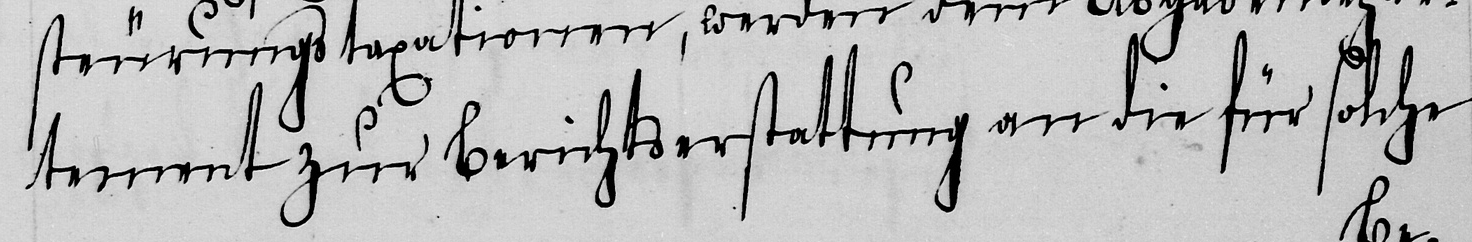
tement zur Berichtserstattung an die für solche
